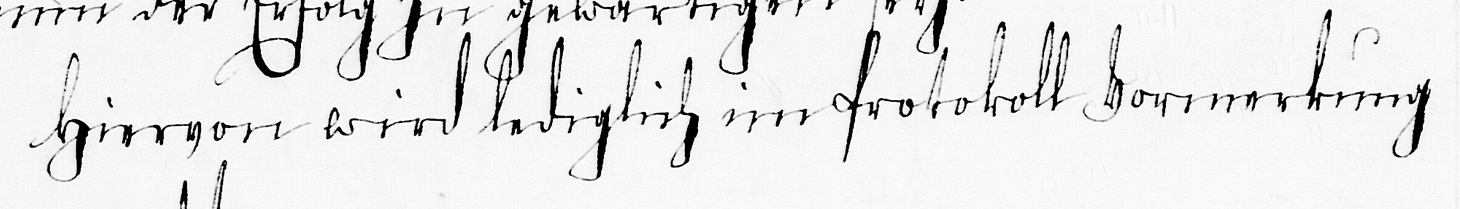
Hiervon wird lediglich im Protokoll Vormerkung
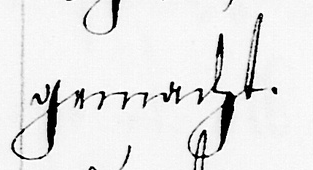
gemacht.
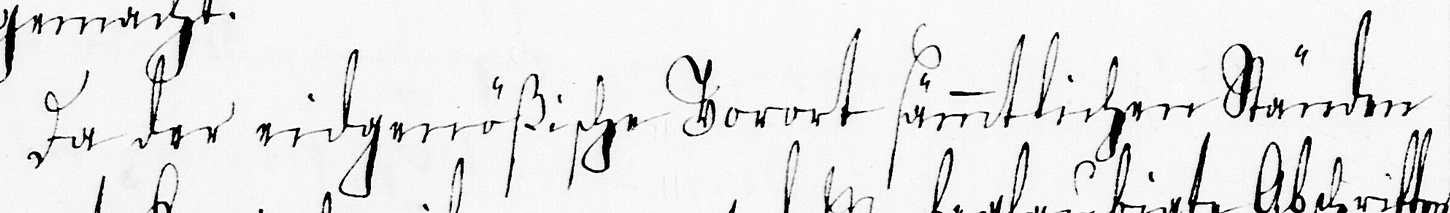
Da der eidgenößische Vorort sämmtlichen Ständen
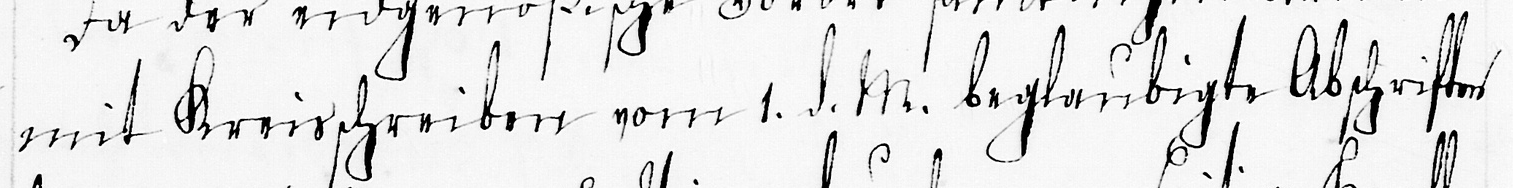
mit Kreisschreiben vom 1. d. M. beglaubigte Abschriften
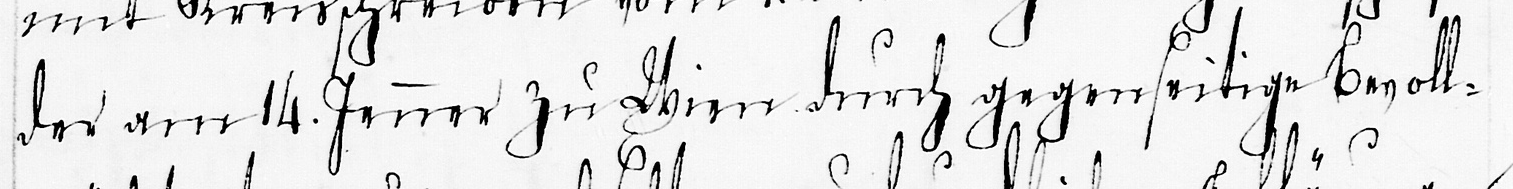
der am 14. Jenner zu Wien durch gegensitige Bevoll¬
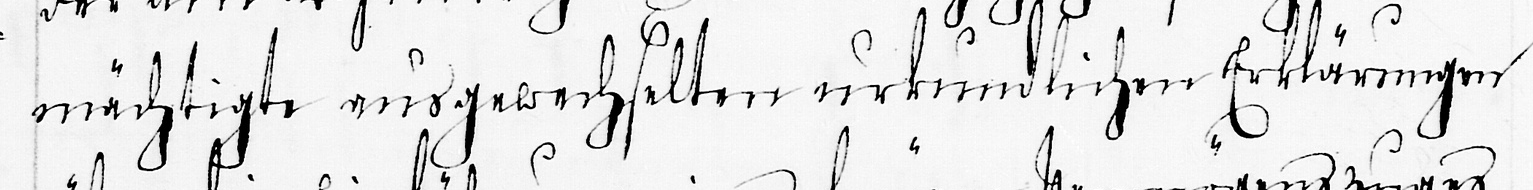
mächtigte ausgewechselten urkundlichen Erklärungen
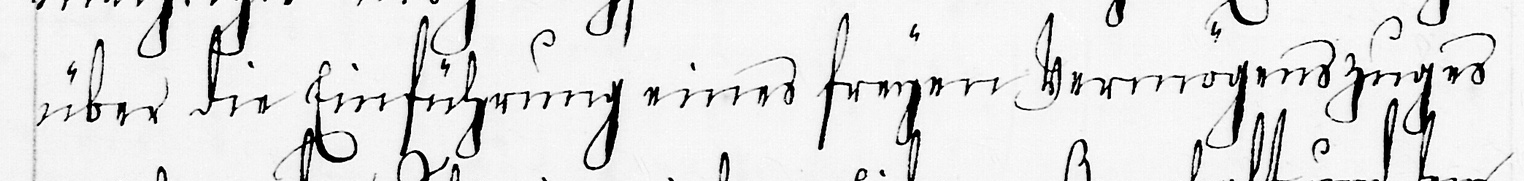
über die Einführung eines freyen Vermögenszuges
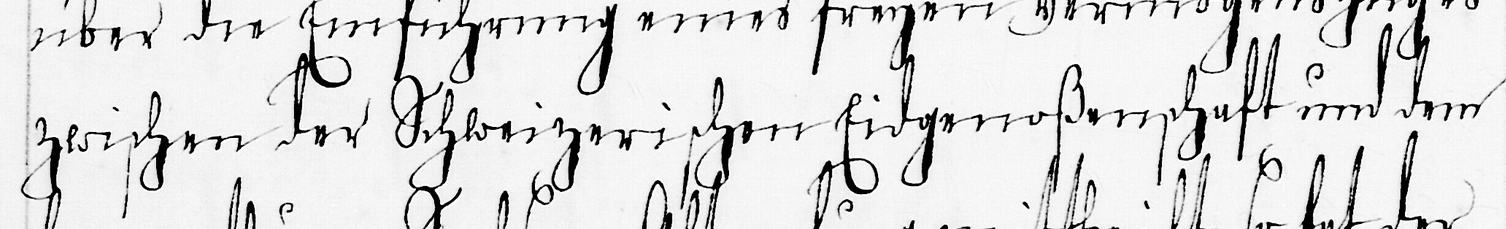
zwischen der Schweizerischen Eidgenoßenschaft und dem
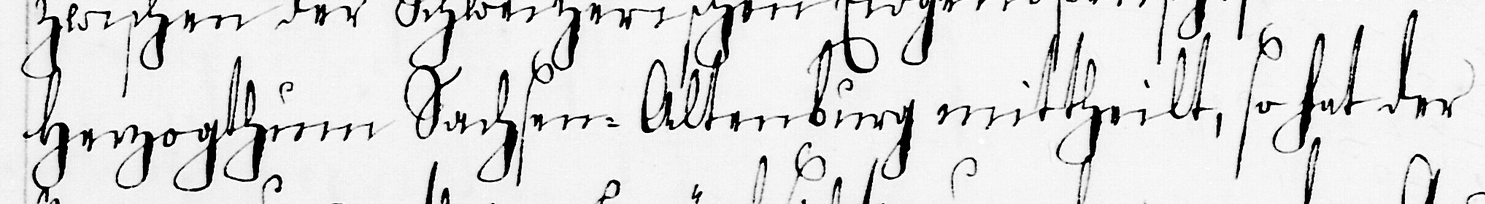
Herzogthum Sachsen-Altenburg mittheilt, so hat der
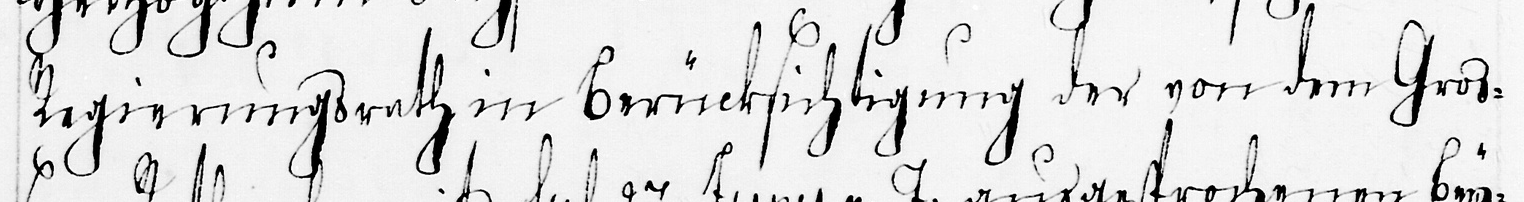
Regierungsrath in Berücksichtigung der von dem Groß¬
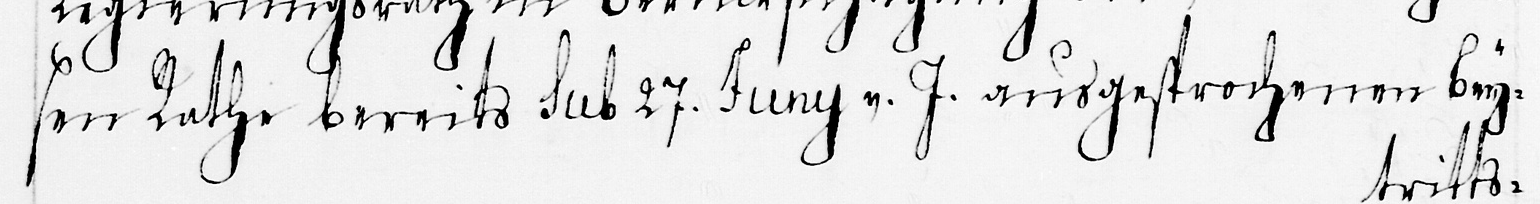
en Rathe bereits sub 27. Juny v. J. ausgesprochenen Bey-
